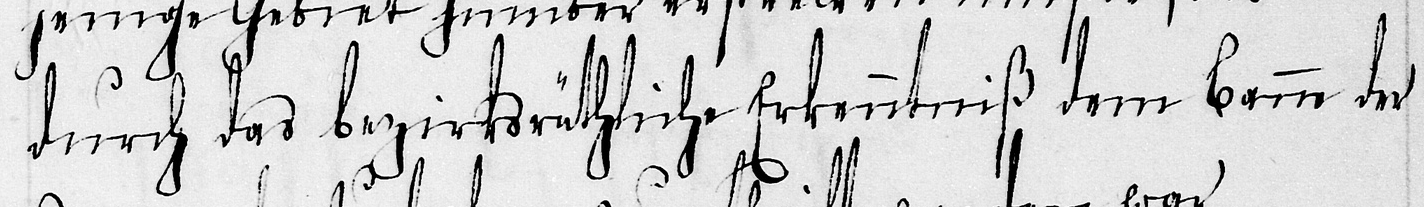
durch das bezirksräthliche Erkenntniß dem Banne
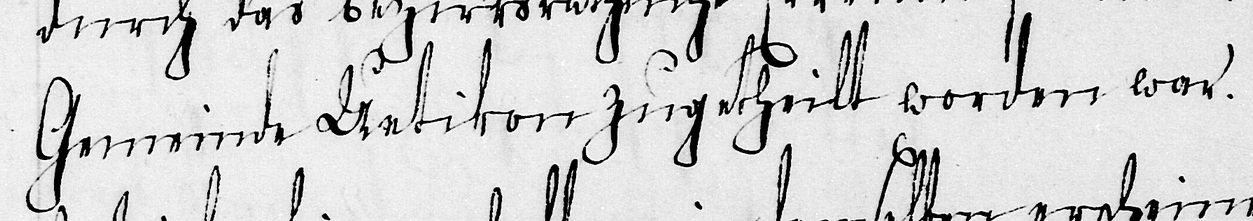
Gemeinde Uetikon zugetheilt worden war.
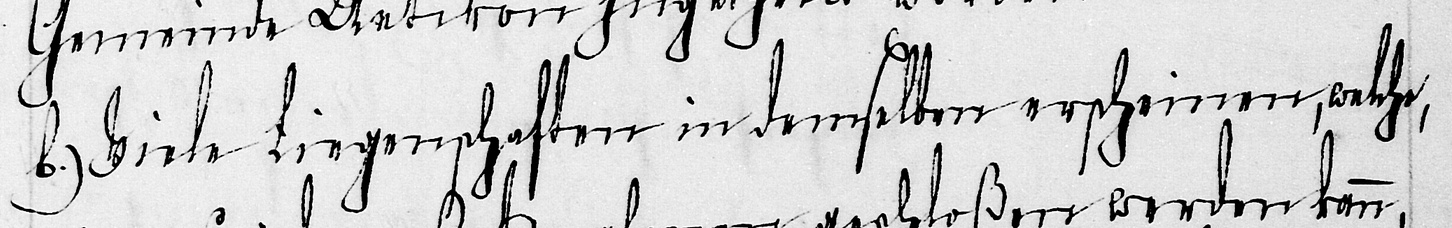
b.) Viele Liegenschaften in demselben erscheinen, welche
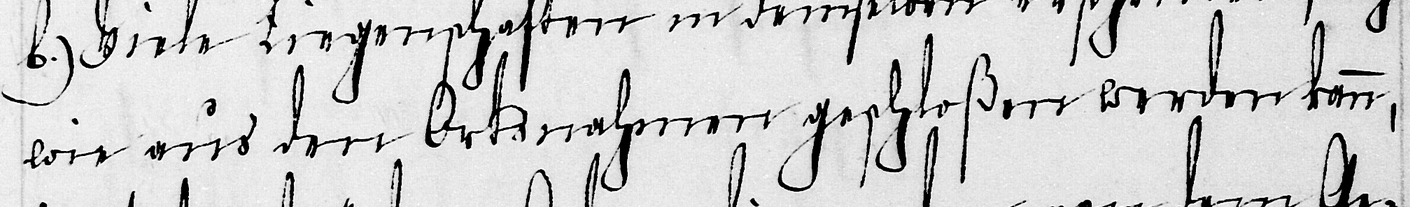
wie aus den Ortsnahmen geschloßen werden kann,
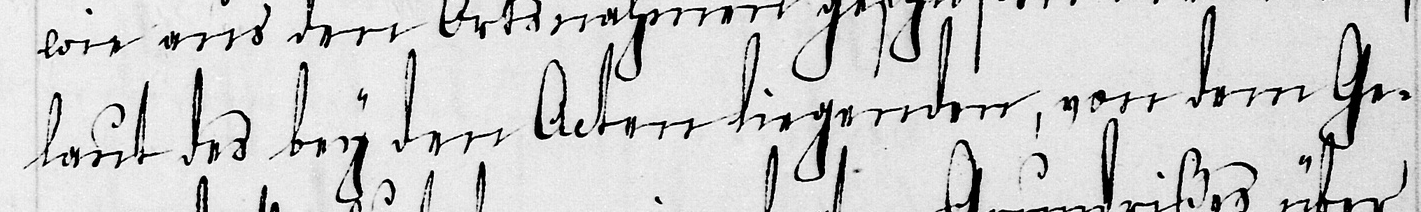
laut des bey den Acten liegenden, von dem Ge¬
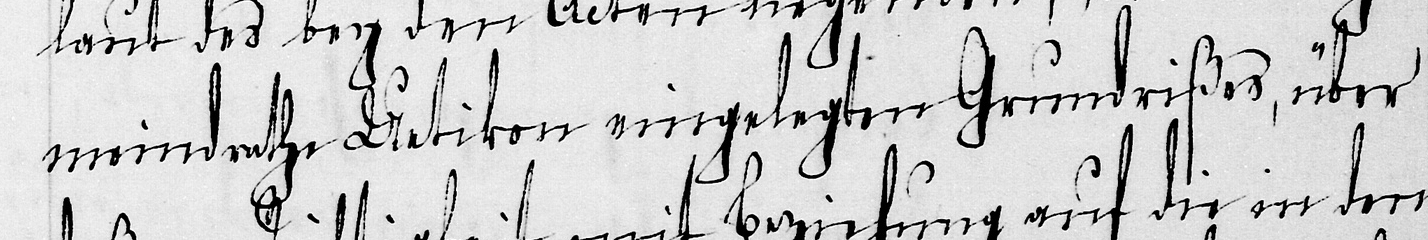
meindrathe Uetikon eingelegten Grundrißes, über
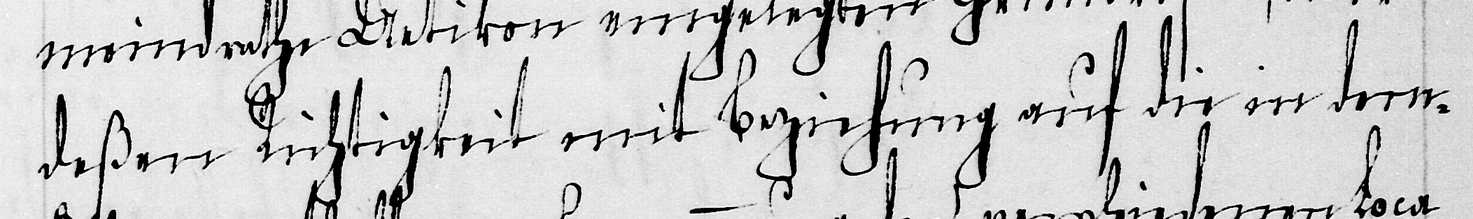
deßen Richtigkeit mit Beziehung auf die in dem¬
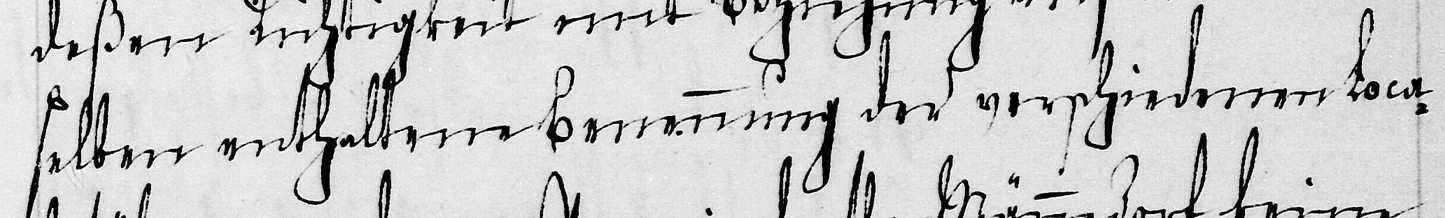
selben enthaltene Benennung der verschiedenen Loca¬
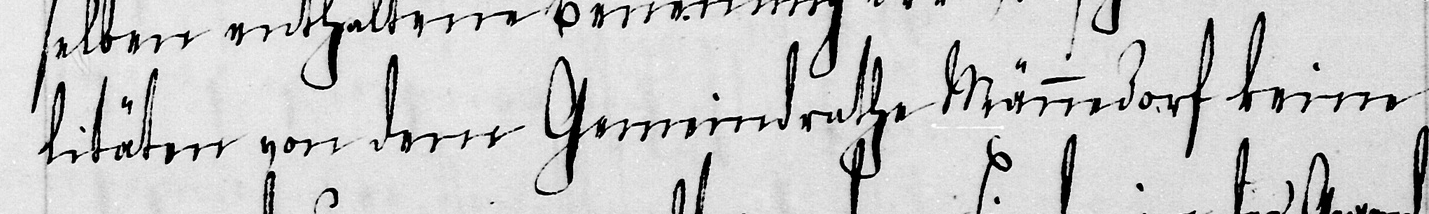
litäten von dem Gemeindrathe Männedorf keine
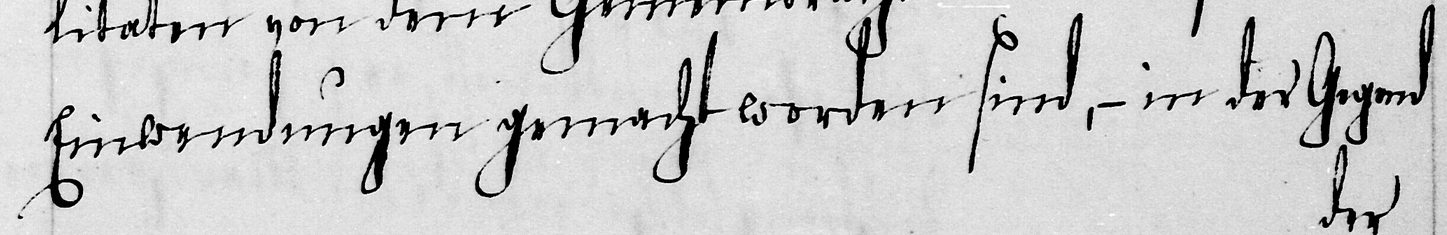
Einwendungen gemacht worden sind, – in der Gegend
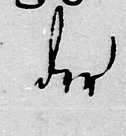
der
